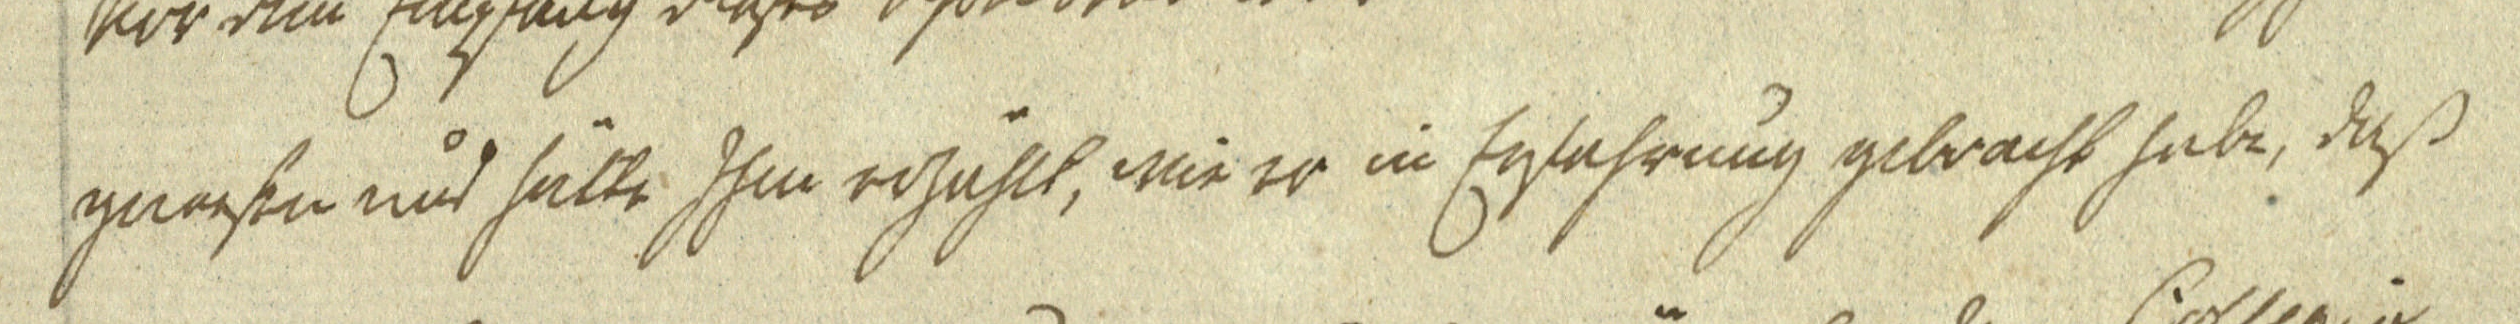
gewesen und habe Ihm erzählt, wie Erfahrung gebracht habe, daß
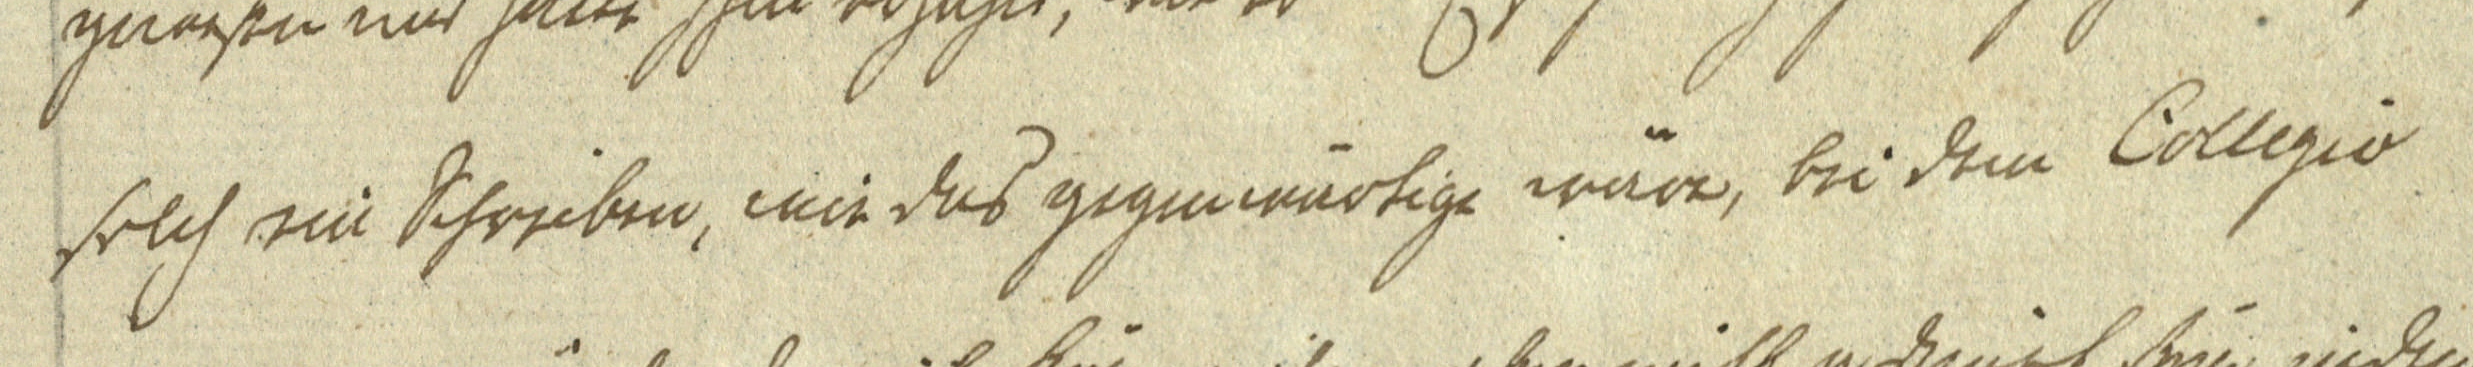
solch ein Schreiben, wie das gegenwärtige wäre, bei dem Collegio
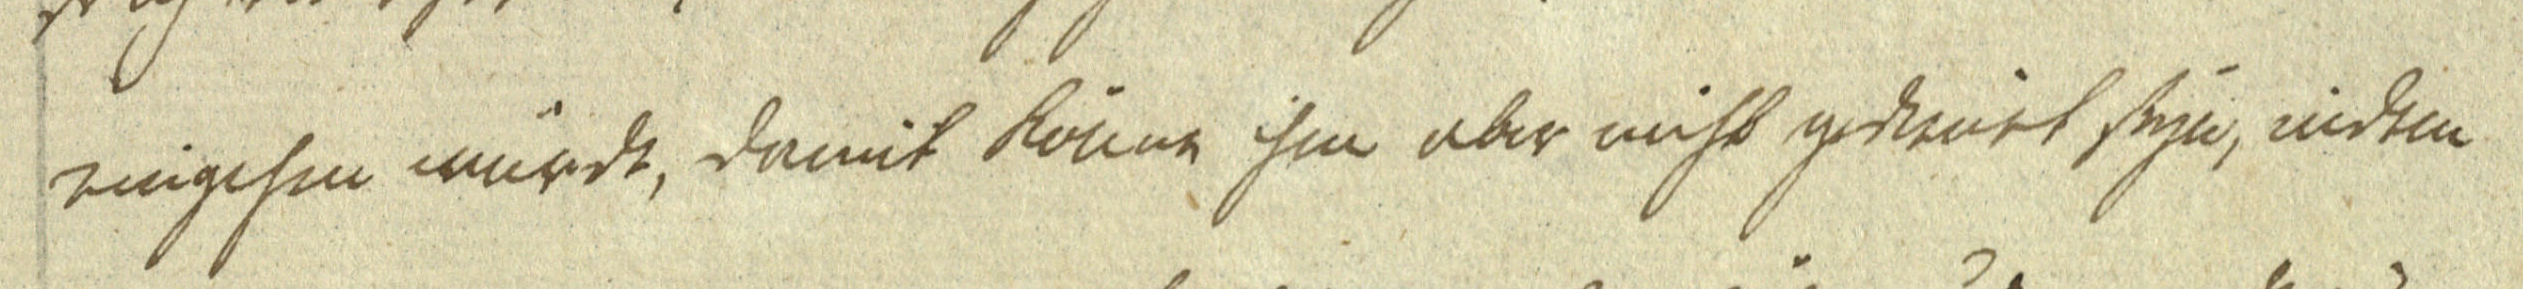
eingehen würde, damit könne ihm aber nicht gedienet seÿn, indem
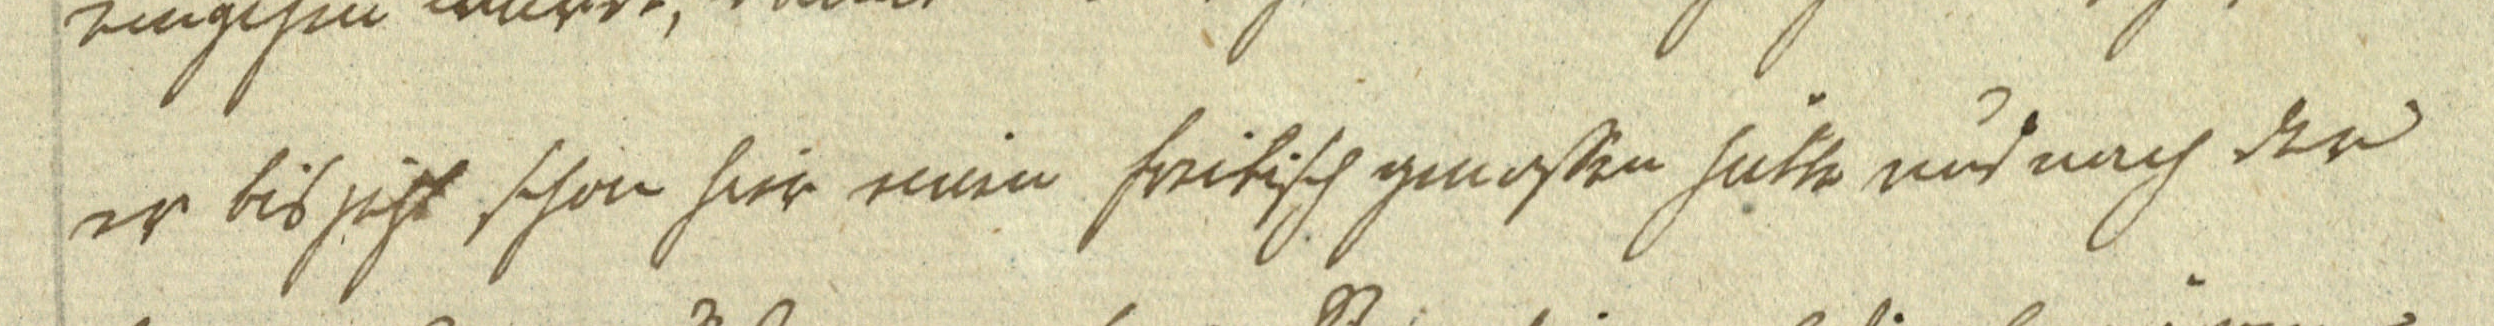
er bis jetzt schon hier einen Freitisch genossen hätte und nach der
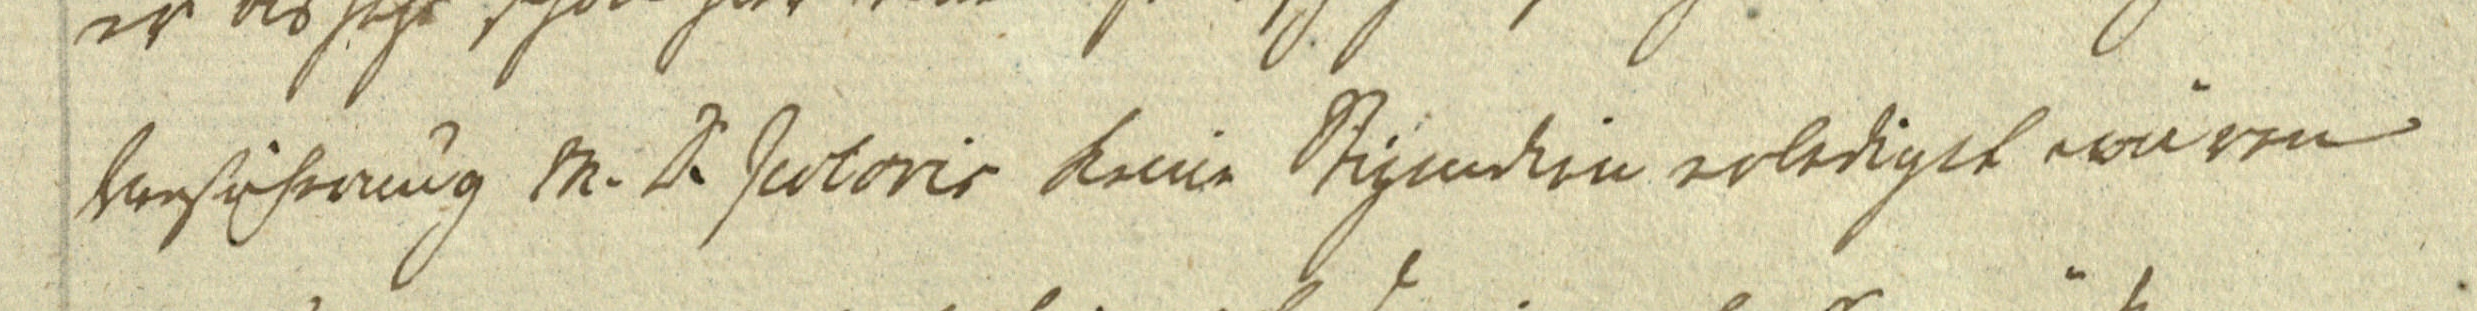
Versicherung M. D. Rectoris keine Stipendien erlediget wären
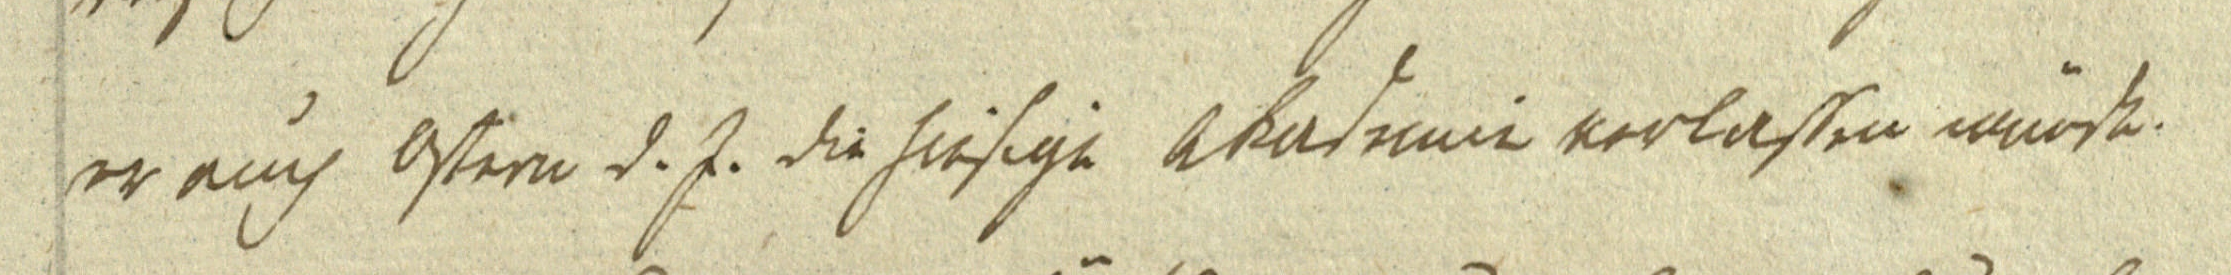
er auch Ostern d. J. die hiesige Akademie verlassen würde.
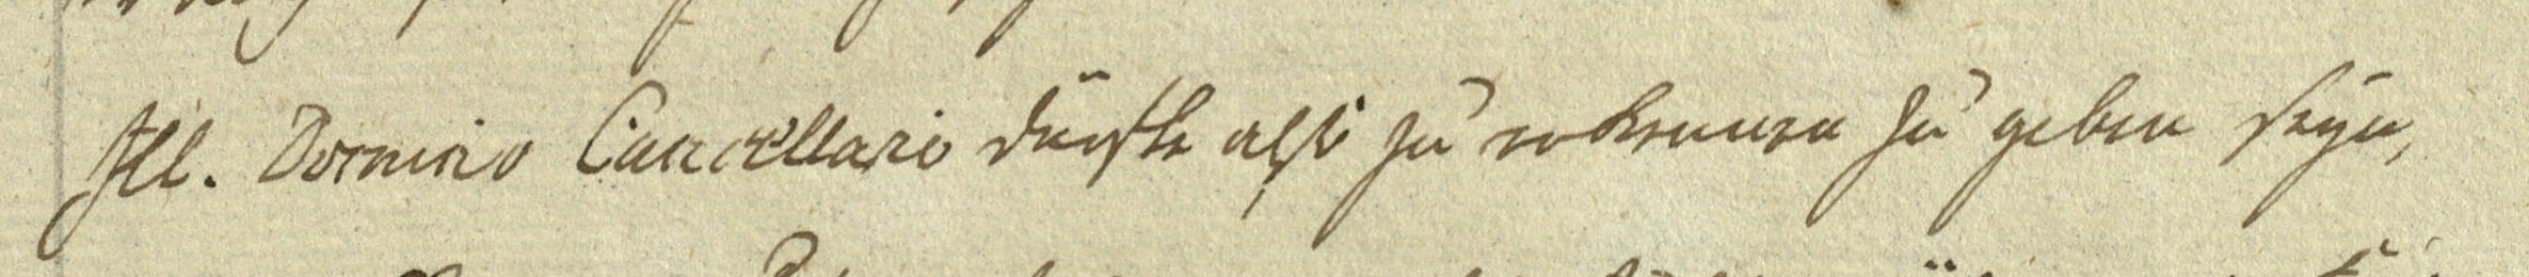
Ill. Domino Cancellario dürfte als zu erkennen zu geben seÿn,
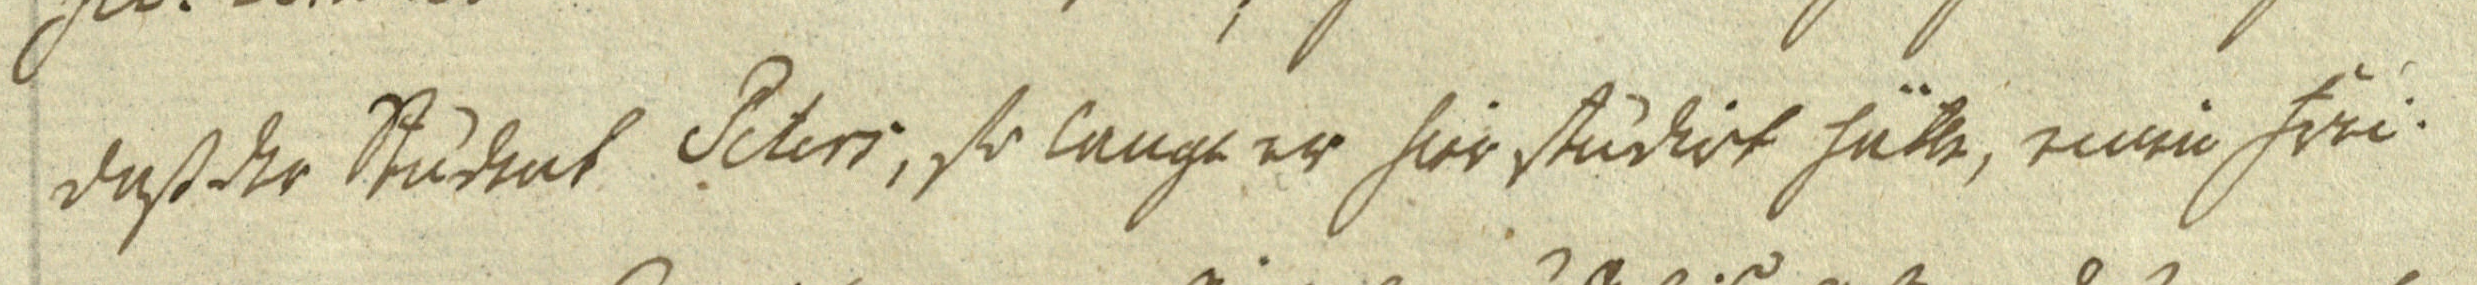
daß der Student Peters, so lange er hier studirt hätte, einen Frei¬
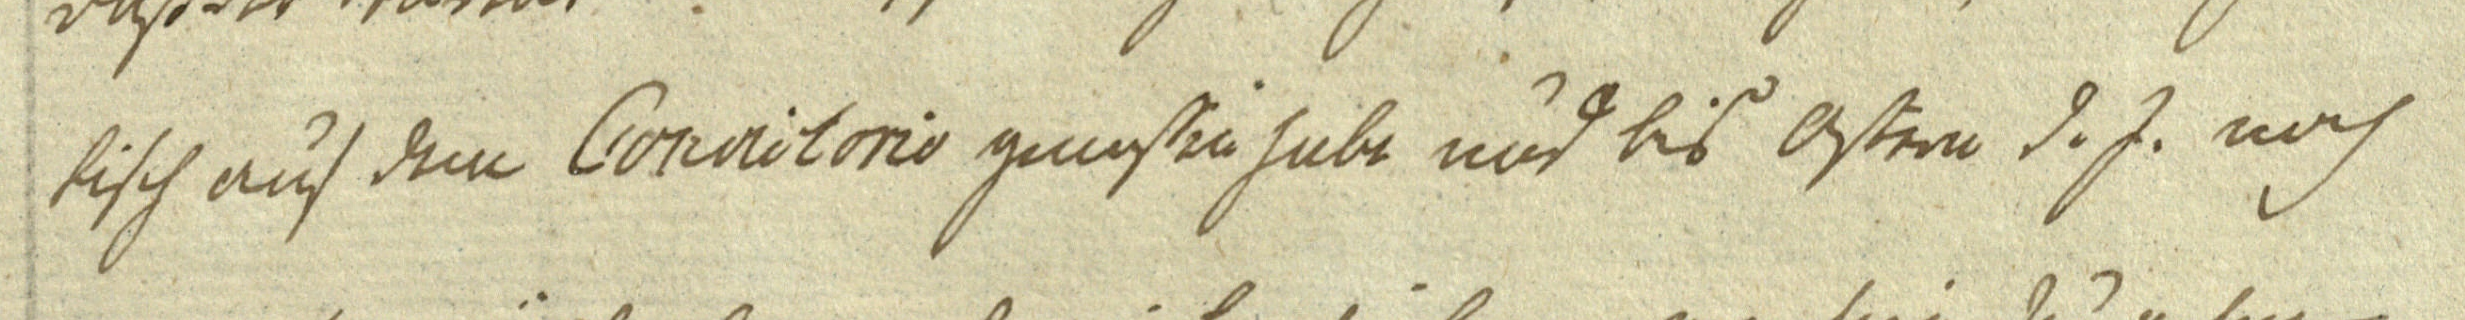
tisch auf dem Convictorio genossen habe und bis Ostern d. J. noch
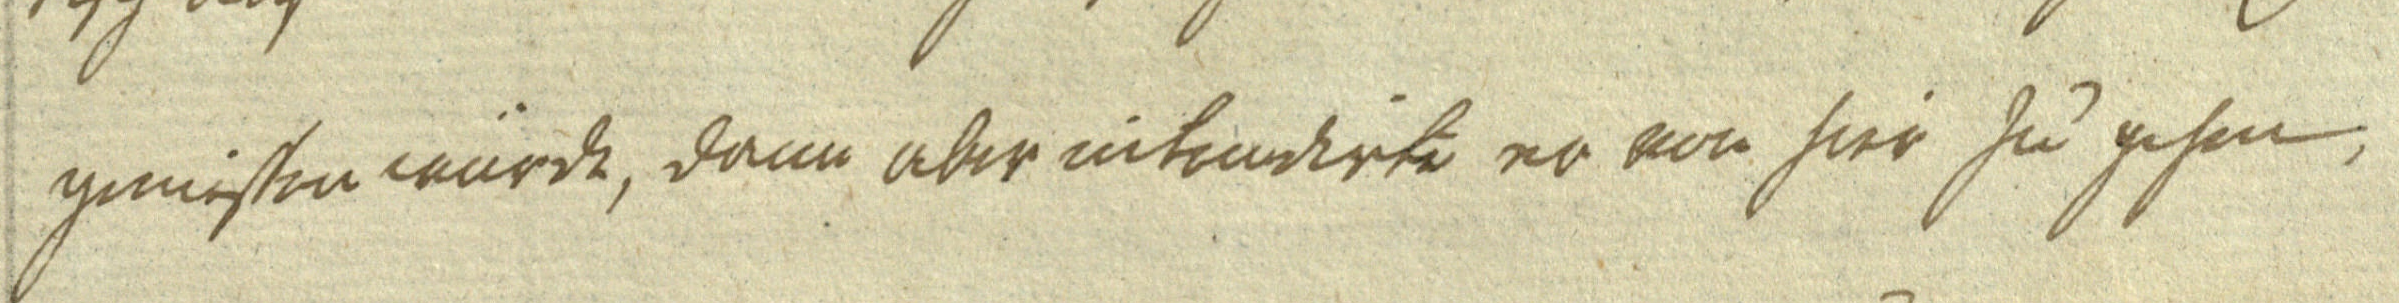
geniessen würde, dann aber intendirte er von hier zu gehen,
